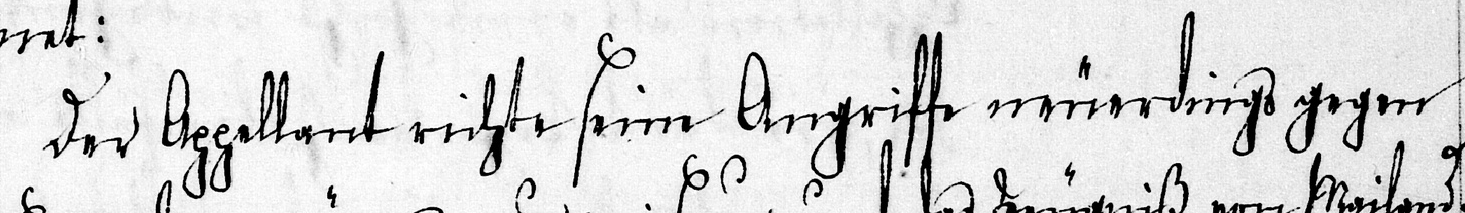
Der Appellant richte seine Angriffe neuerdings gegen
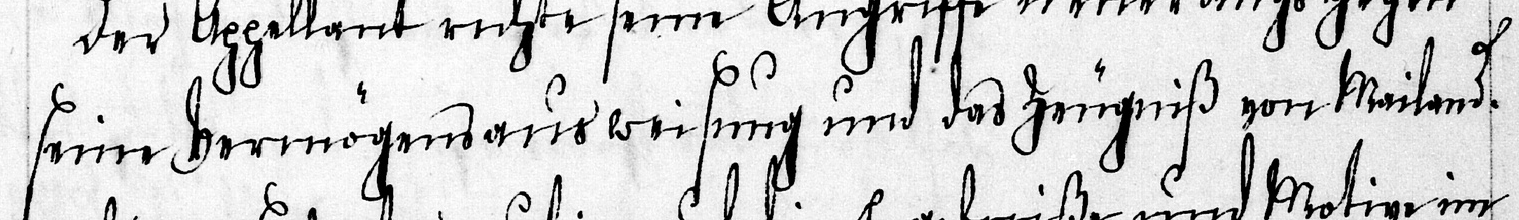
seine Vermögensausweisung und das Zeugniß von Mailand.
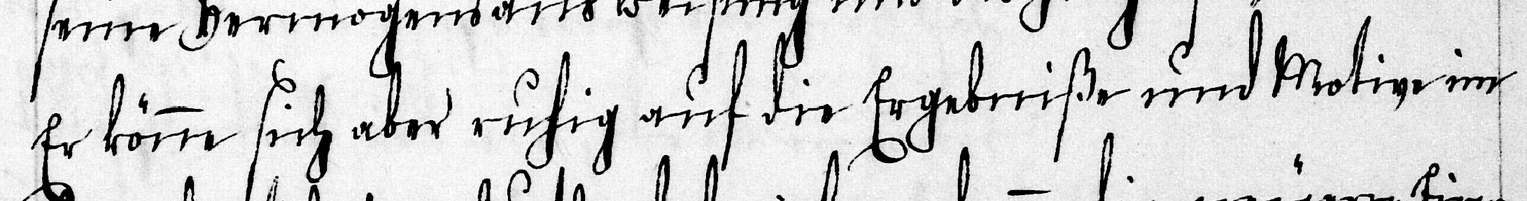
Er könne sich aber ruhig auf die Ergebniße und Motive im
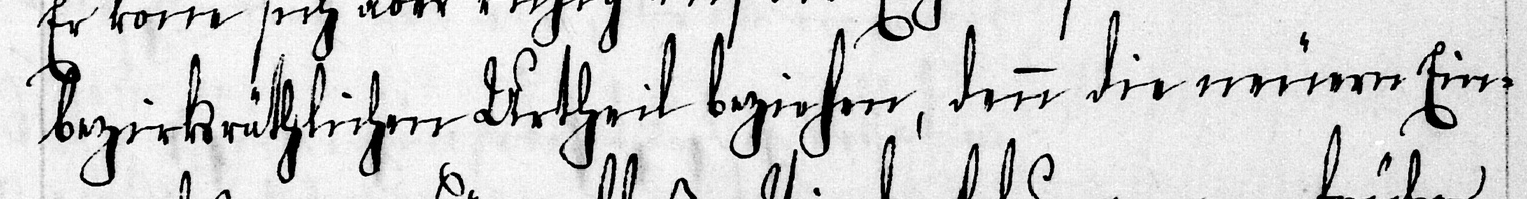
bezirksräthlichen Urtheil beziehen, denn die neuen Ein¬
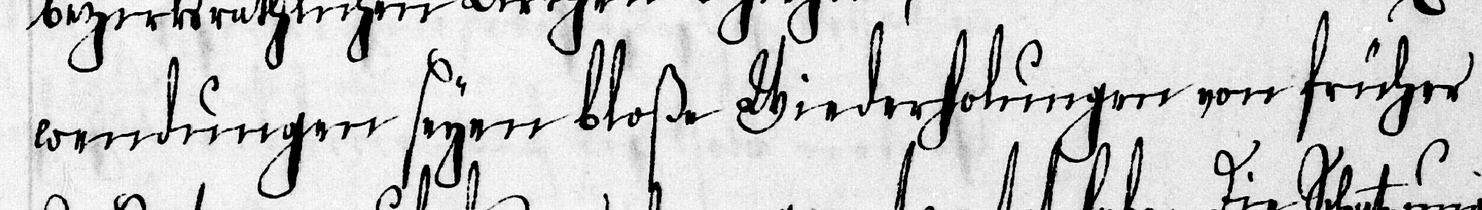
wendungen seyen bloße Wiederholungen von früher
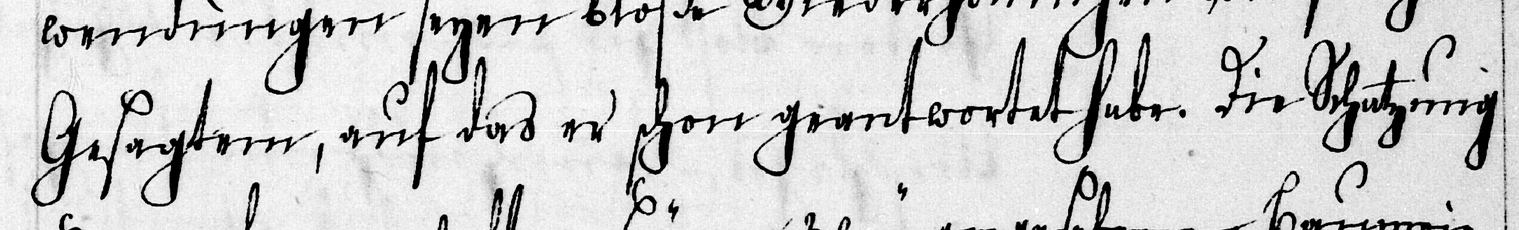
Gesagtem, auf das er schon geantwortet habe. Die Schatzung
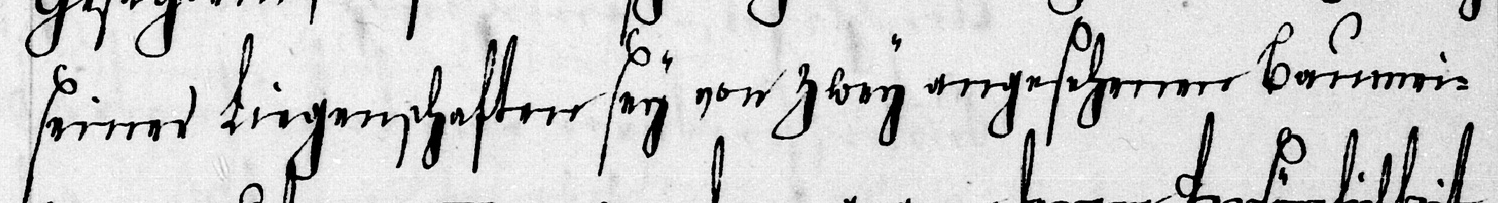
seiner Liegenschaften sey von zwey angesehenen Baumei¬
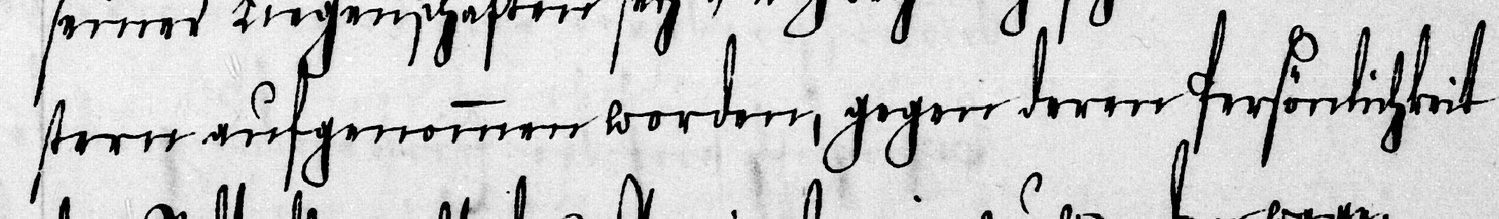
stern aufgenommen worden, gegen deren Persönlichkeit
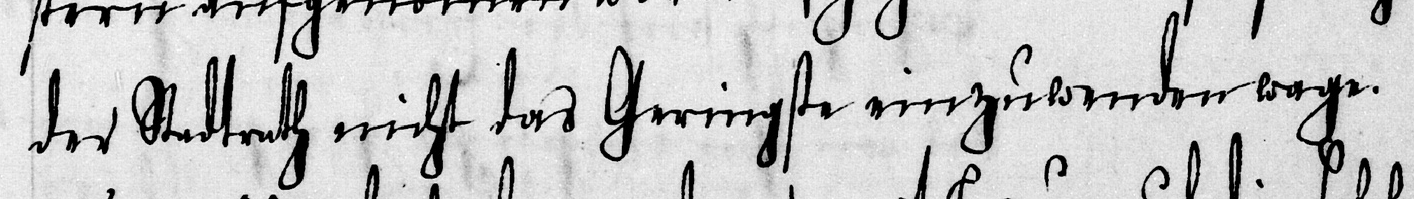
der Stadtrath nicht das geringste einzuwenden wage.
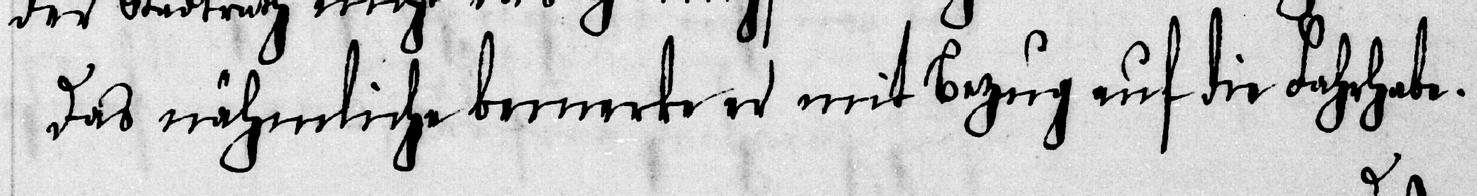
Das nähmliche bemerke er mit Bezug auf die Fahrhabe.
